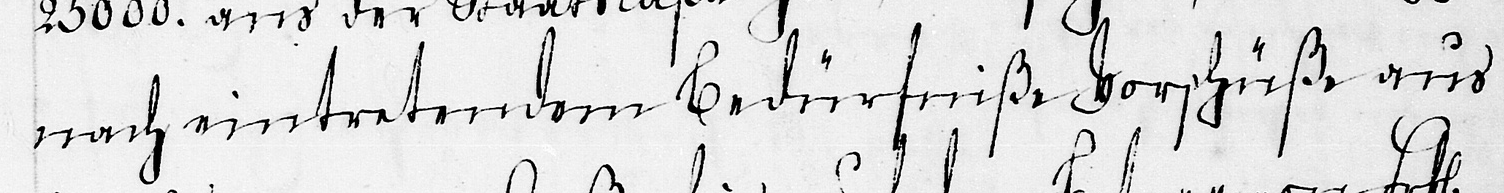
nach eintretendem Bedürfniße Vorschüße aus
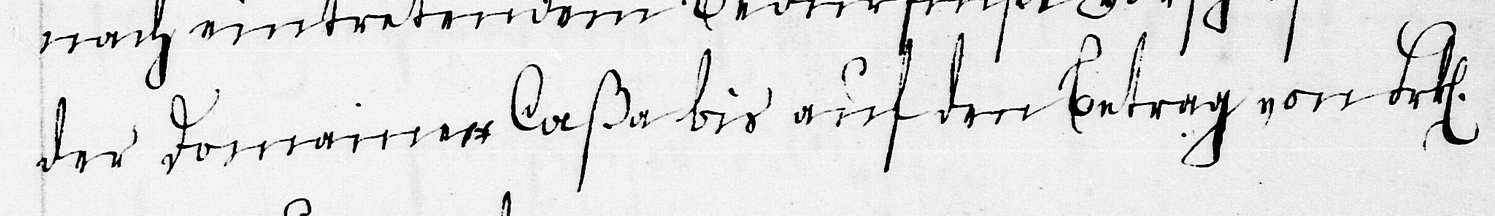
der Domaine-Caßa bis auf den Betrag von Frk[e¬
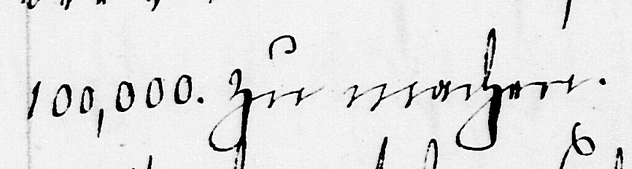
100,000. zu machen.
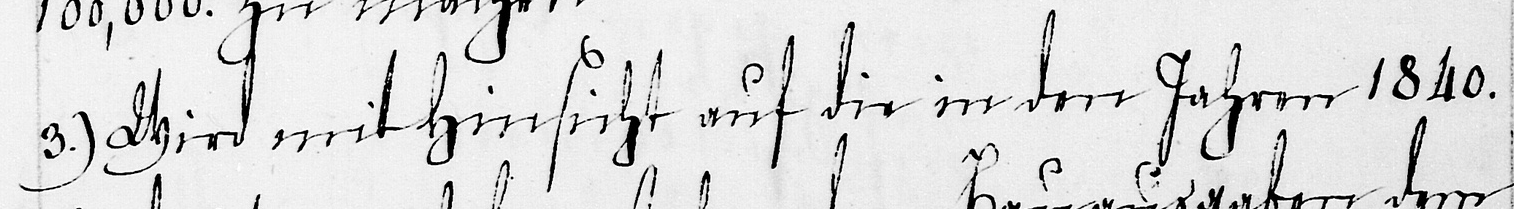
3.) Wird mit Hinsicht auf die in den Jahren 1840.
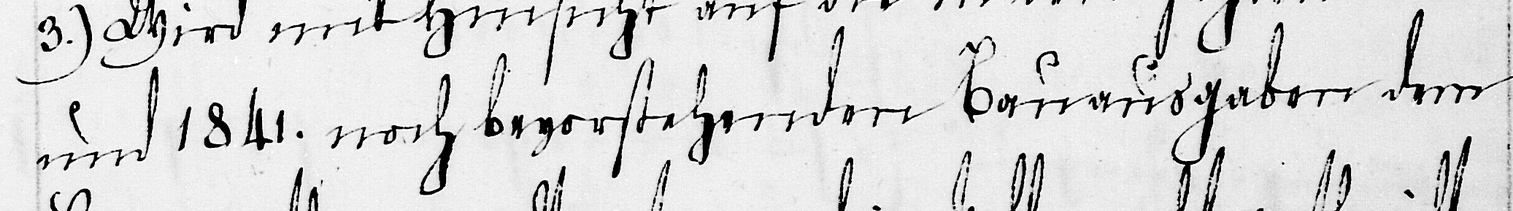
und 1841. noch bevorstehenden Bauausgaben dem
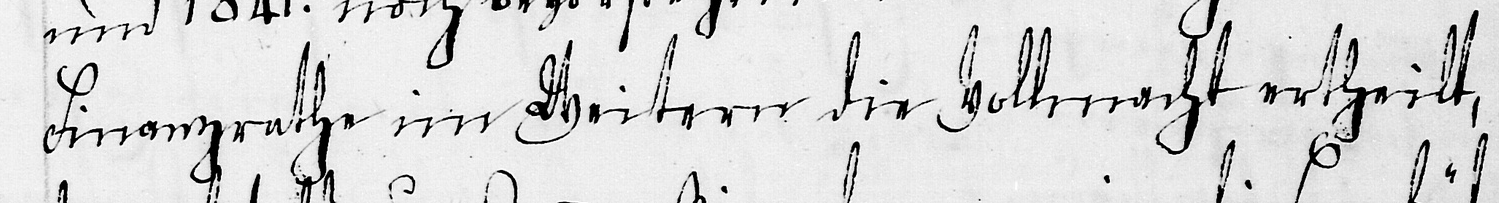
Finanzrathe im Weitern die Vollmacht ertheilt,
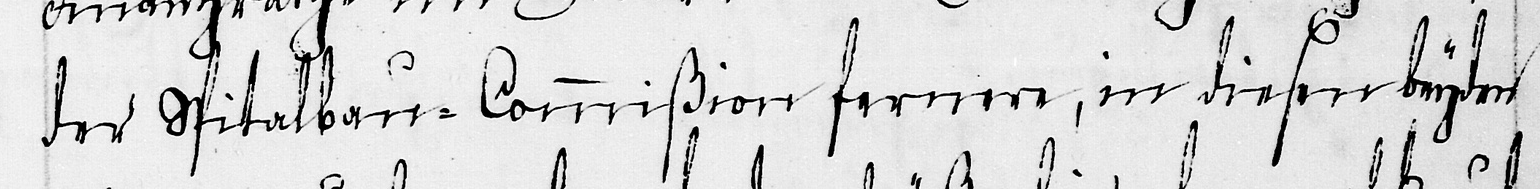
der Spitalbau-Commißion fernere, in diesen beyden
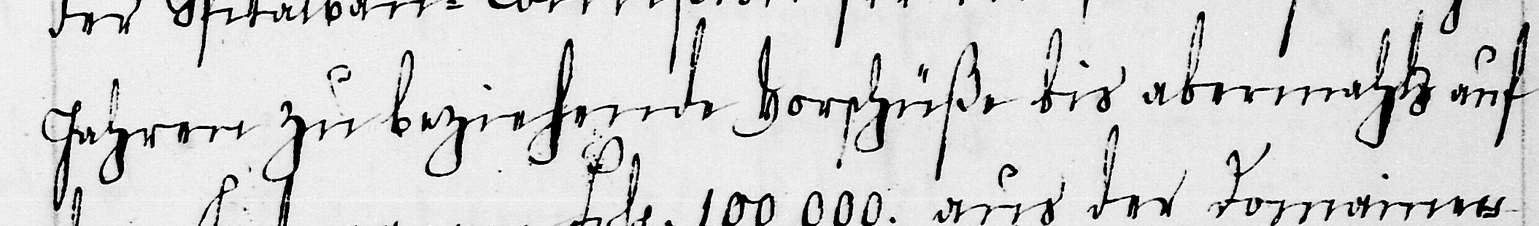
Jahren zu beziehende Vorschüße bis abermahls auf
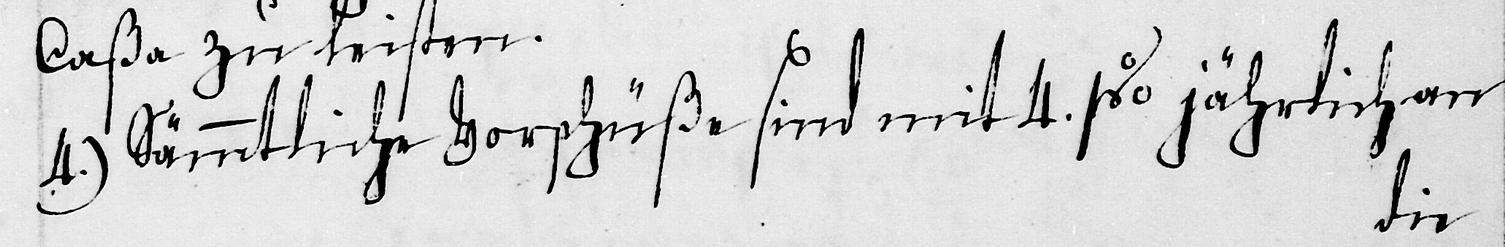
4.) Sämmtliche Vorschüße sind mit 4.% jährlich an
